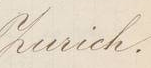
Zurich.
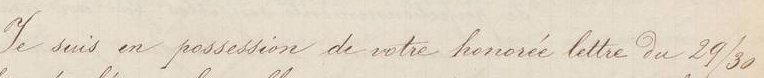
Je suis en possession de votre honorée lettre du 29/30
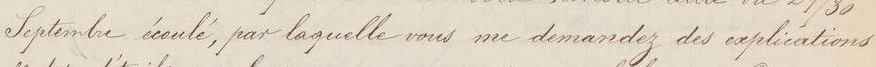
Septembre écoulé, par laquelle vous me demandez des explications
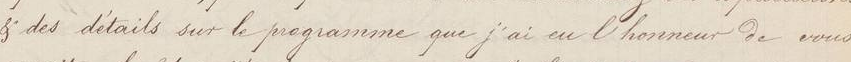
& des détails sur le programme que j'ai eu l'honneur de vous
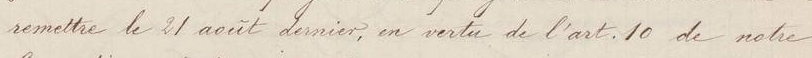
remettre le 21 août dernier, en vertu de l'art. 10 de notre
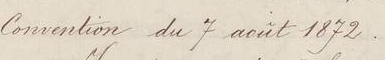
Convention du 7 août 1872.
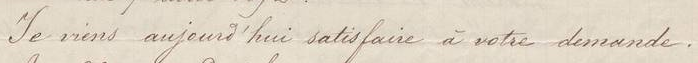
Je viens aujourd'hui satisfaire à votre demande.
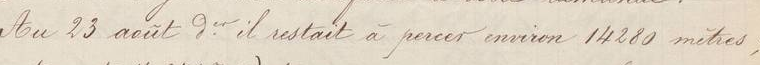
Au 23 août der il restait à percer environ 14280 mètres;
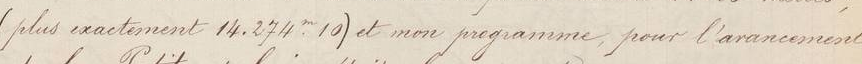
(plus exactement 14.274m 10) et mon programme, pour l'avancement
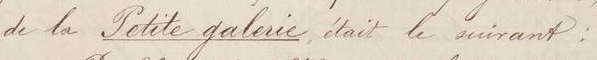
de la Petite galerie, était le suivant:
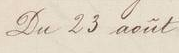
Du 23 août
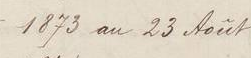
1873 au 23 Août
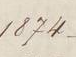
1874
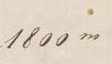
1800 m
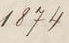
1874
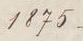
1875
